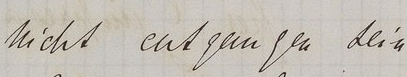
nicht entgangen sein
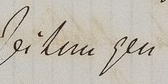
Zeitungen
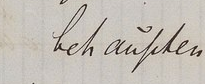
behaupten
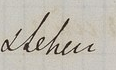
stehen
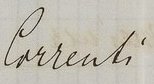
allein u
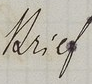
Brief
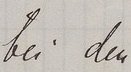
des erstern
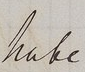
habe
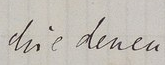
andern Ministern
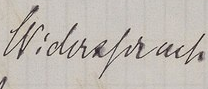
Widerspruch
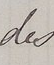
der
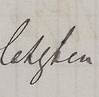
letzten
